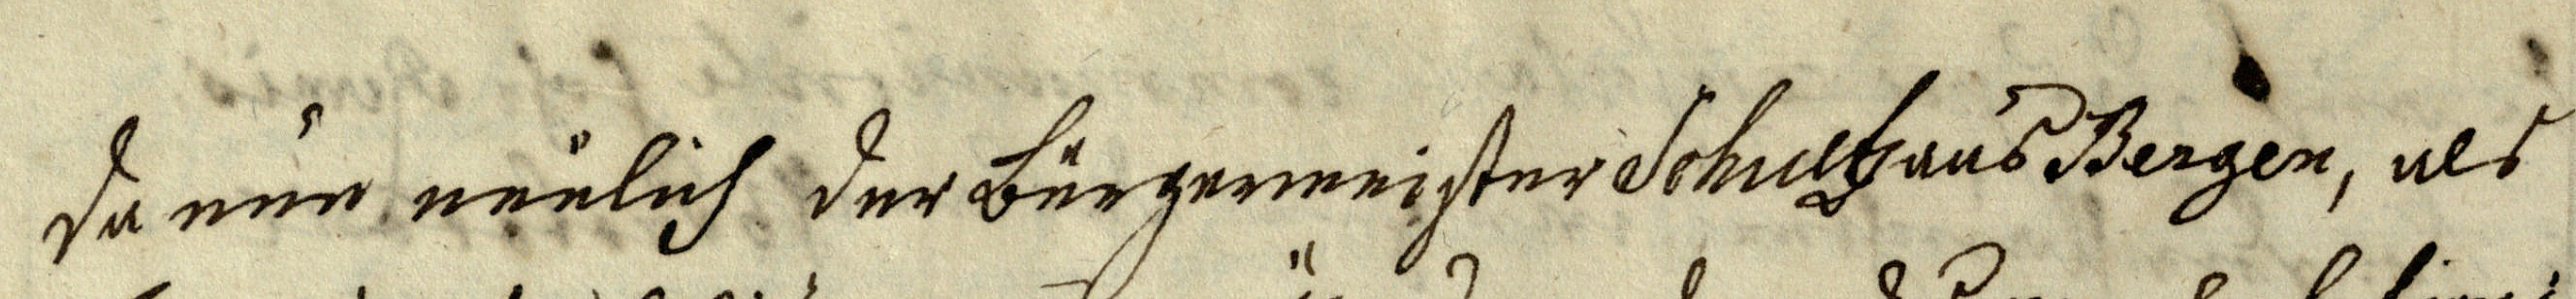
da nun neulich der Bürgermeister Schultz aus Bergen, als
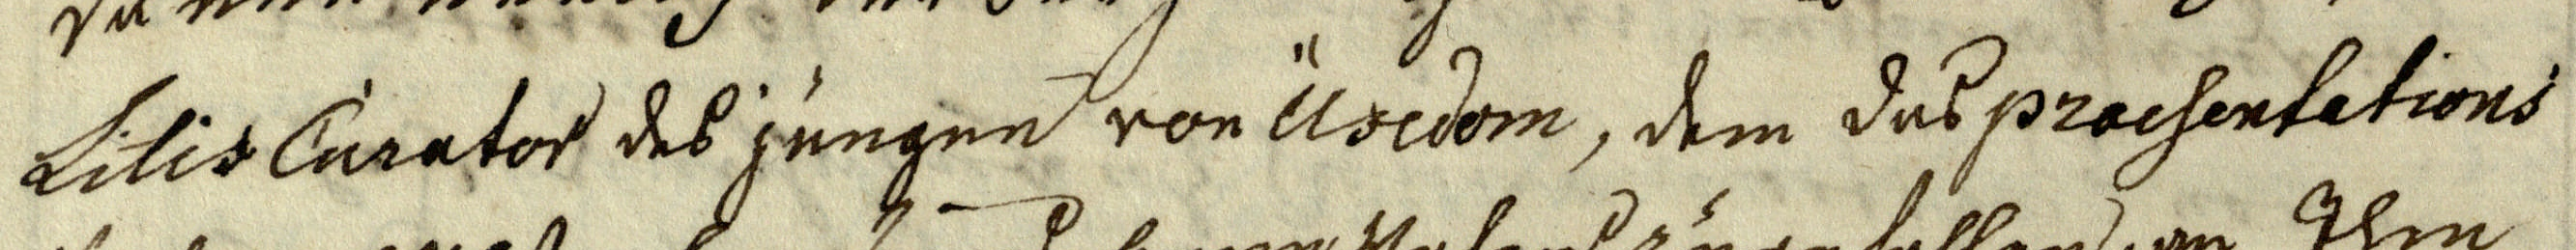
Litis Curator des jungen von Usedom, dem das praesentations
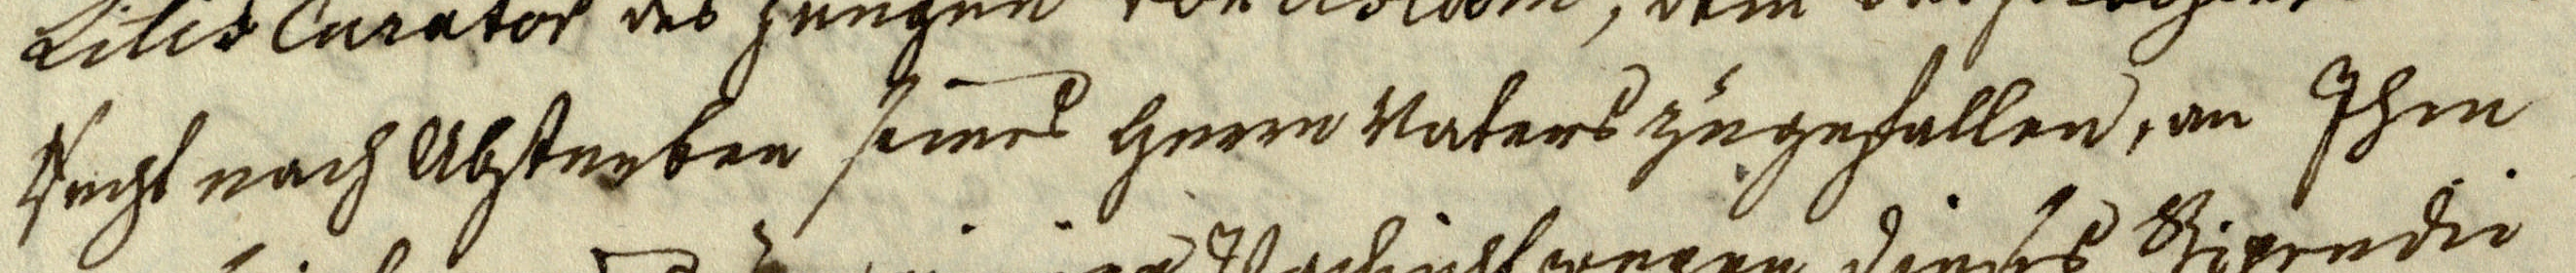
Recht nach Absterben seines Herrn Vaters zugefallen, an Ihm
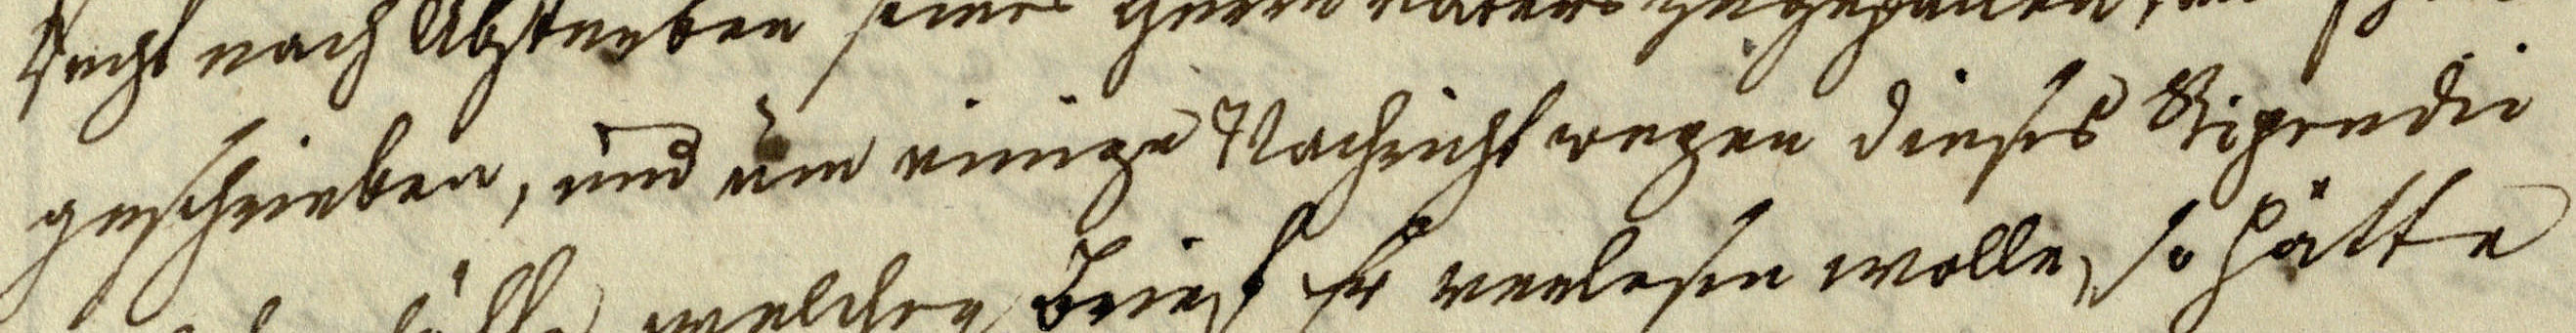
geschrieben, und um einige Nachricht wegen dieses Stipendii
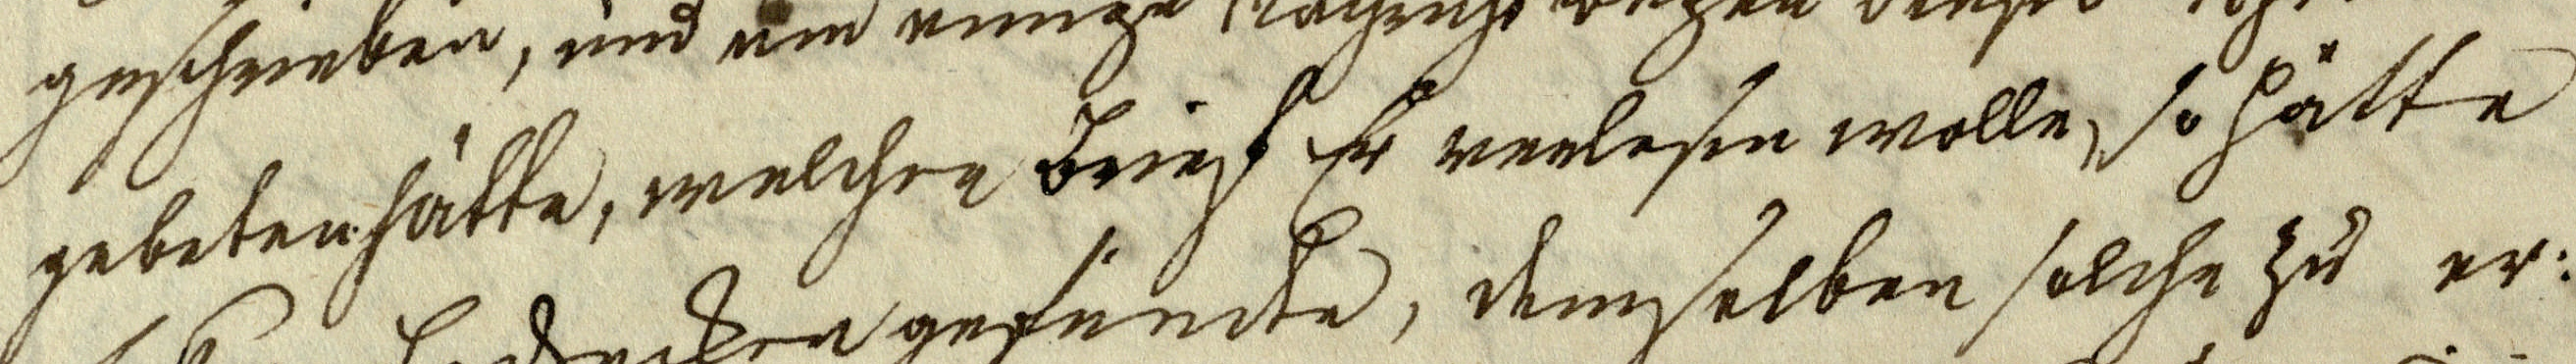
gebeten hätte, welchen Brief Er verlesen wolle, so hätte
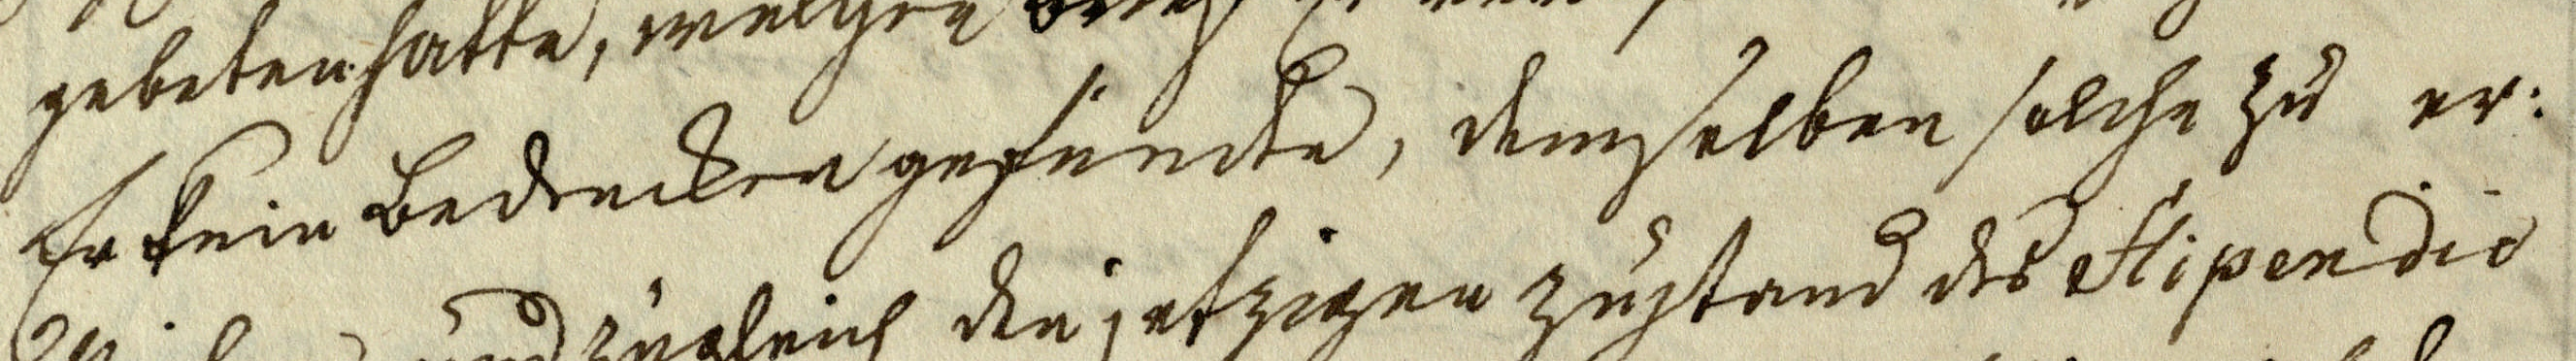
Er kein Bedencken gefunden, demselben solche zu er¬
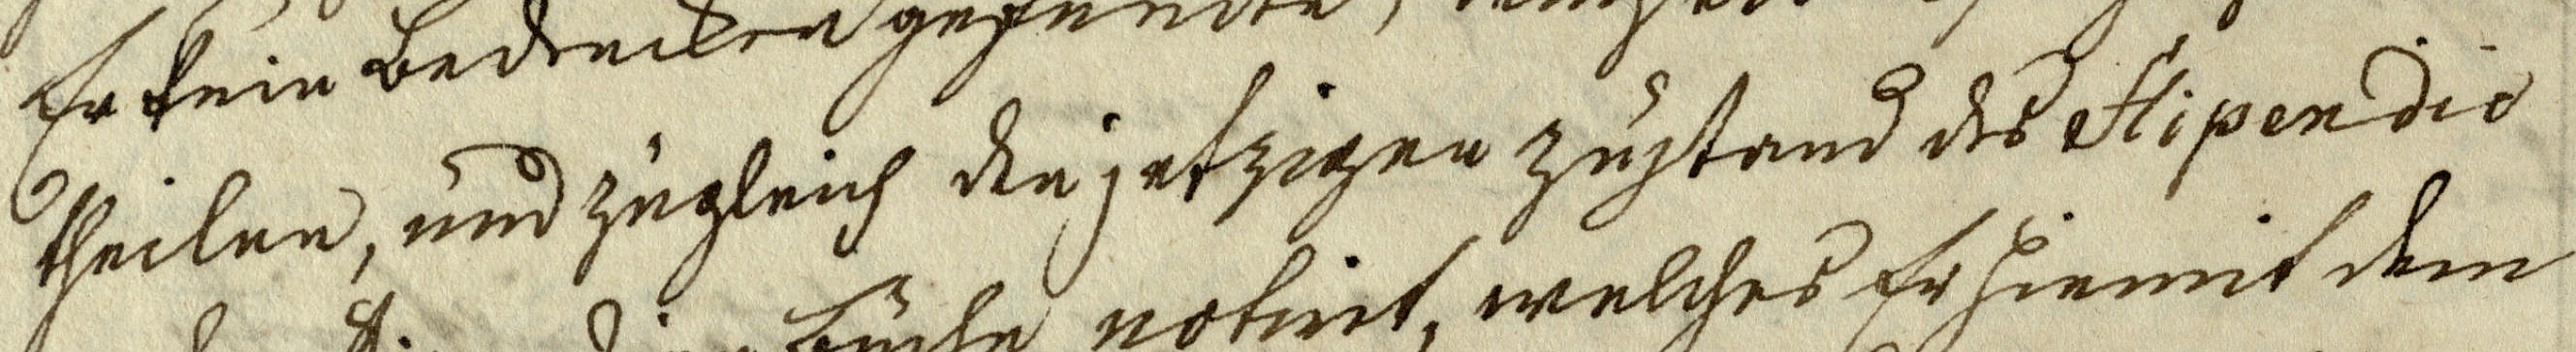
theilen, und zugleich den jetzigen Zustand des Stipendii
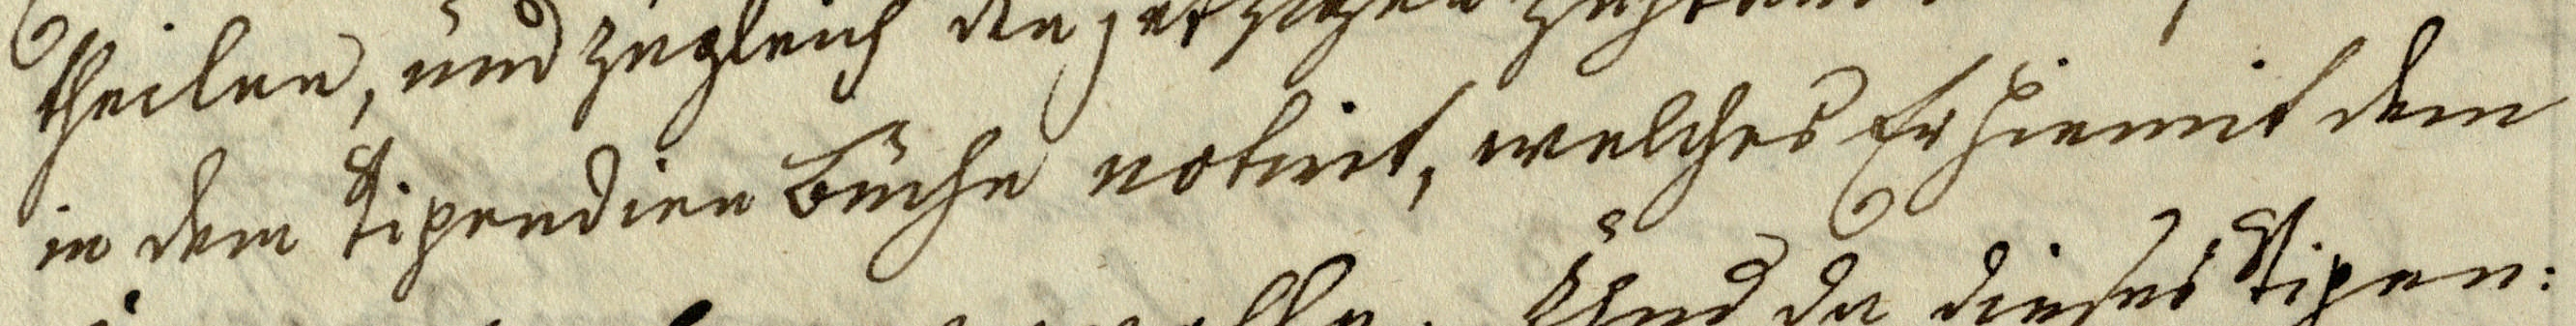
in dem Stipendien Buche notiret, welches er hiemit dem
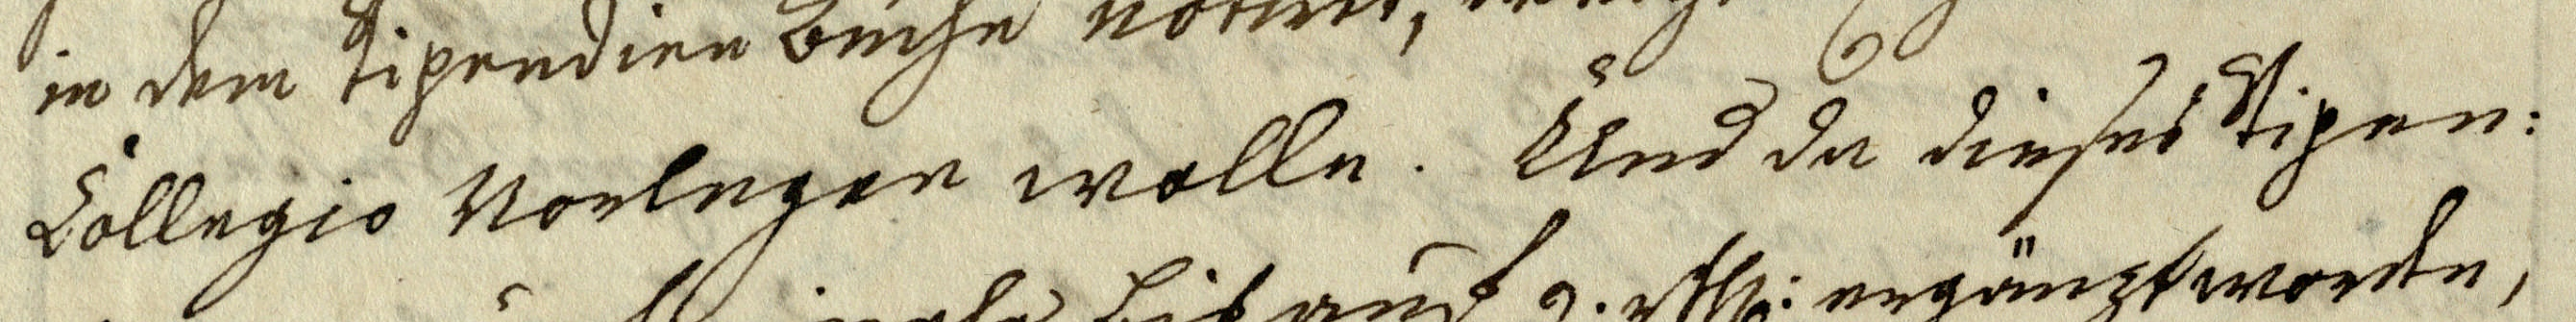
Collegio vorlegen wolle. Und da dieses Stipen¬
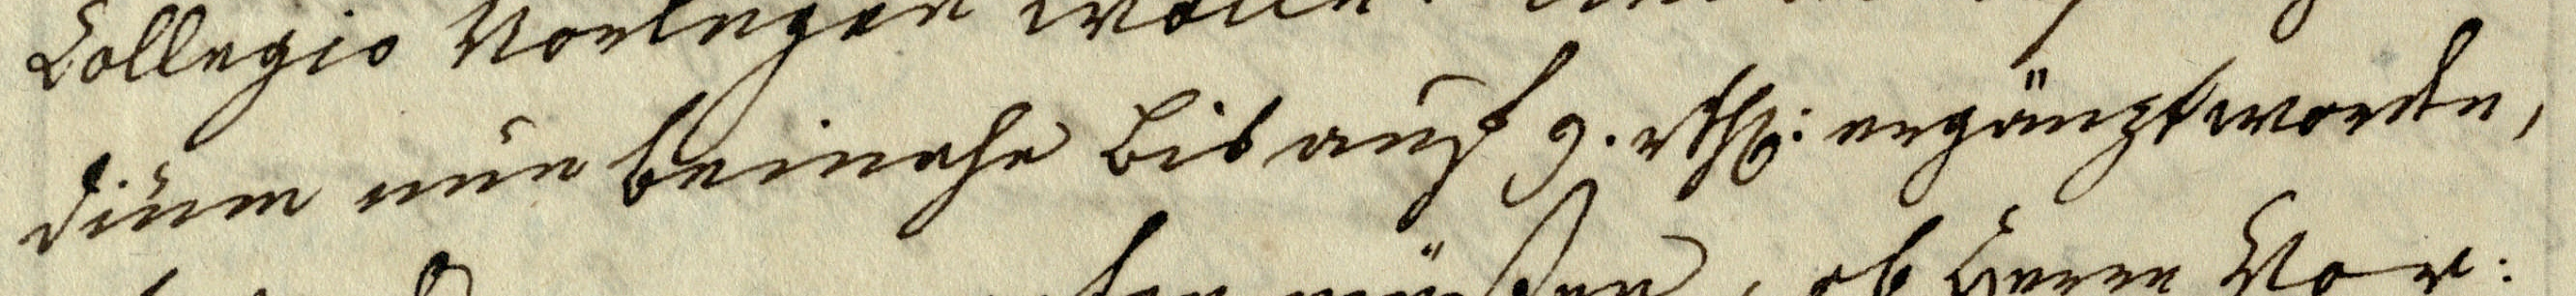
dium nun beinahe bis auf 9. rth. ergänzt worden,
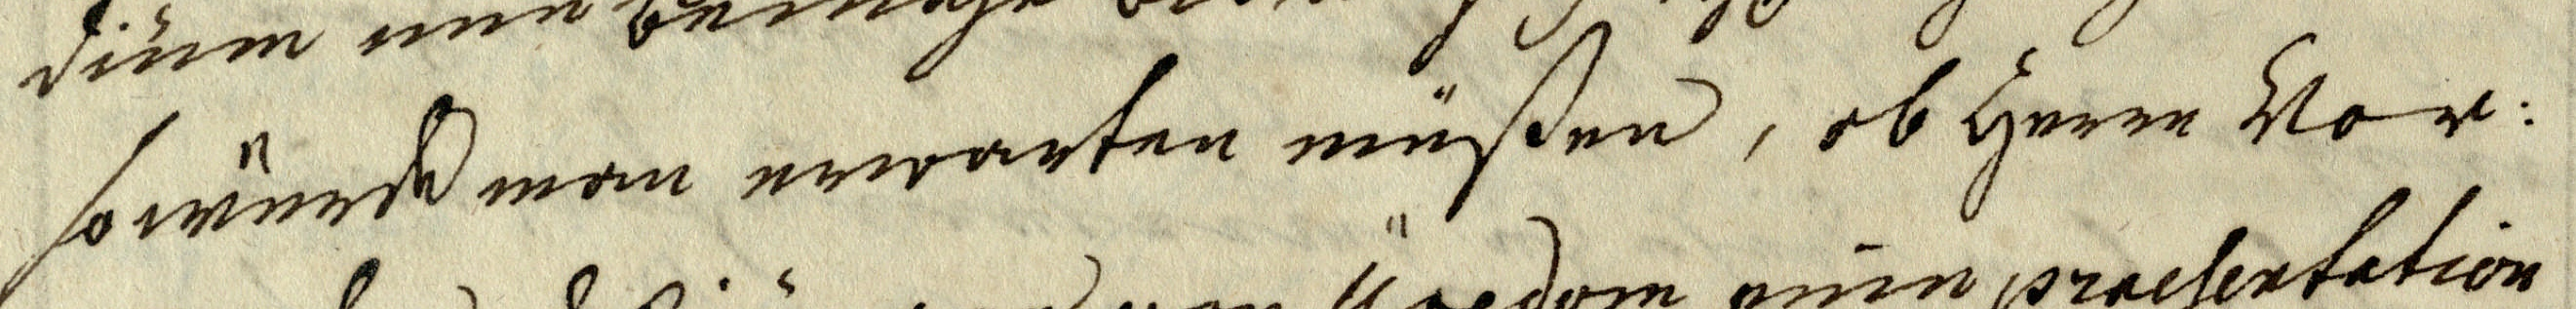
so würde man erwarten müßen, ob Herrn Vor¬
